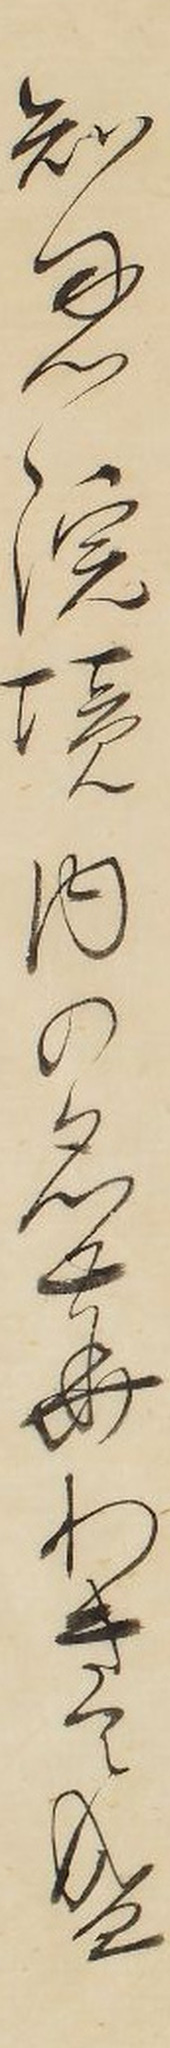知恩院境内の名華わきて盛
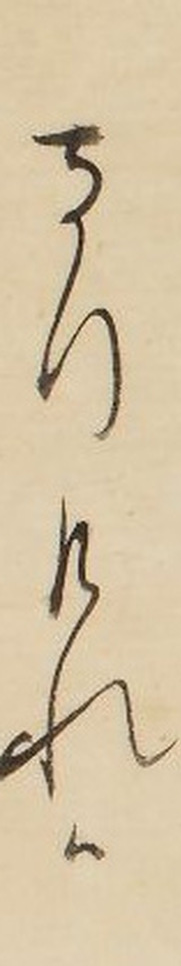なりけれは
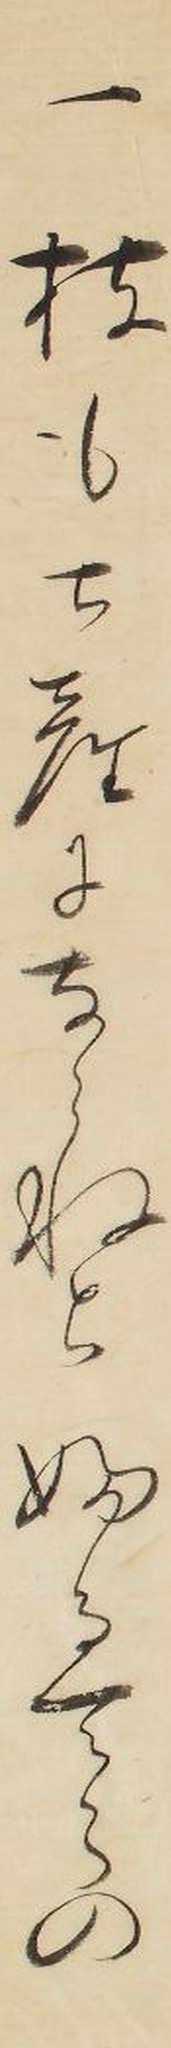一枝も土産にならねとふるてらの
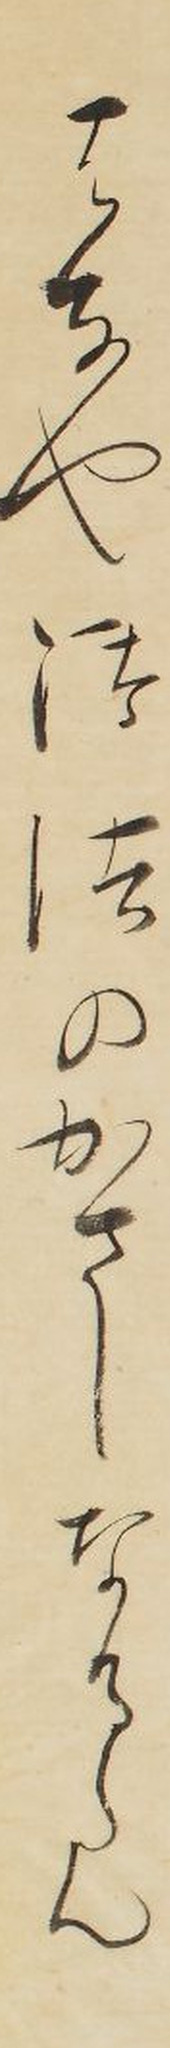はなや御法のかさしなるらん

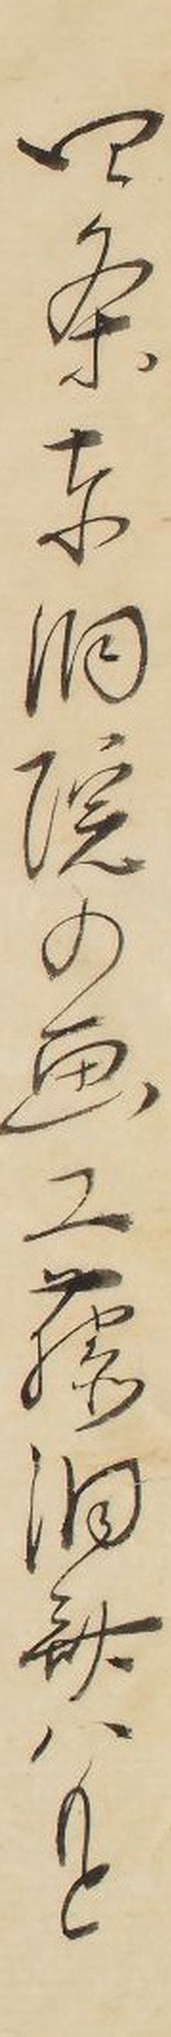四条東洞院の画工藤洞斎はもと
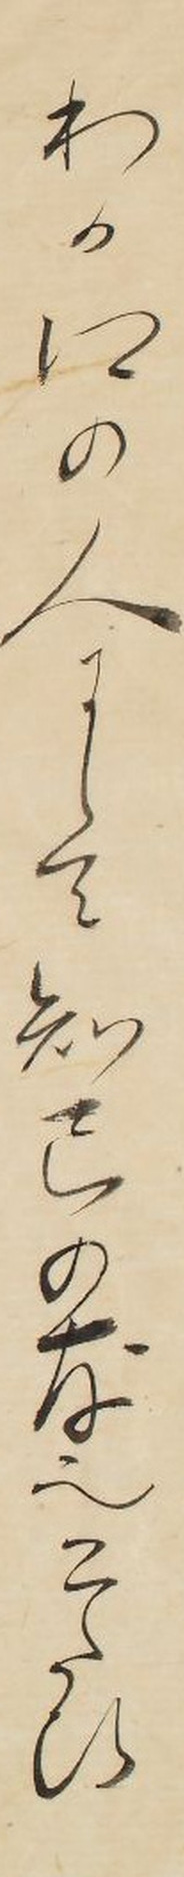わか郷の人にして知己の友也こたひ
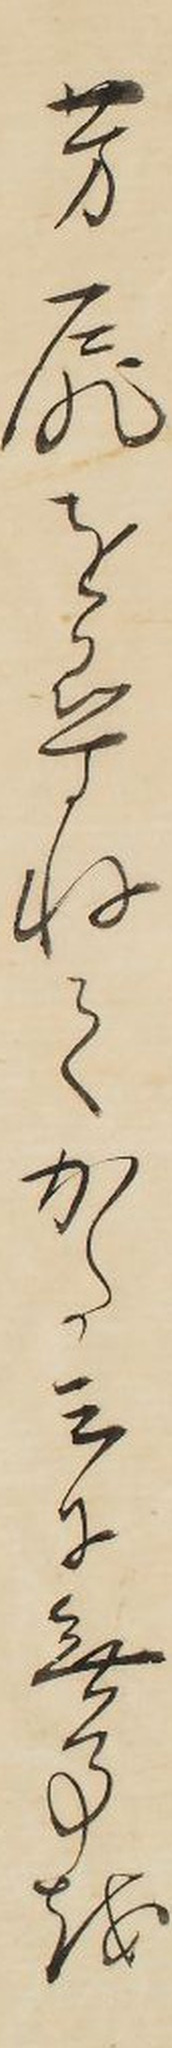芳扉を尋ねてかたみに無事を
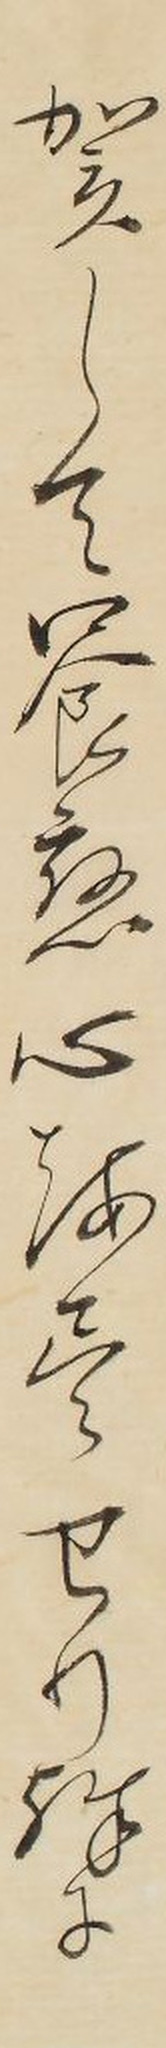賀して饗応心を尽せり殊に
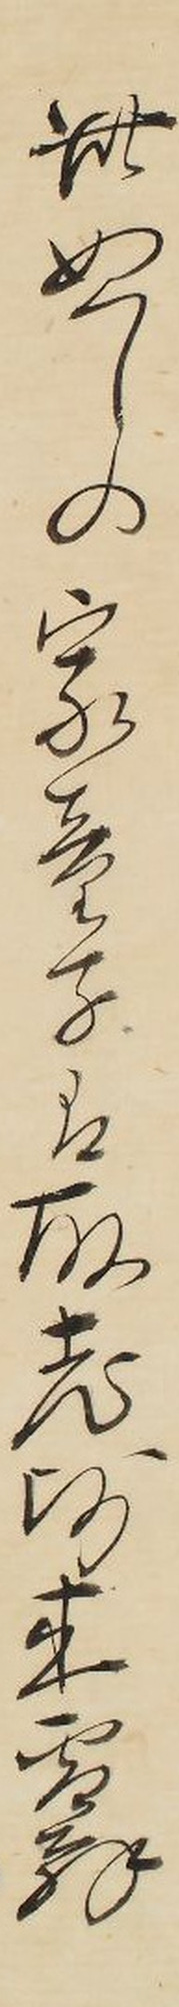此ぬしの家童子は故老師来雪翁の
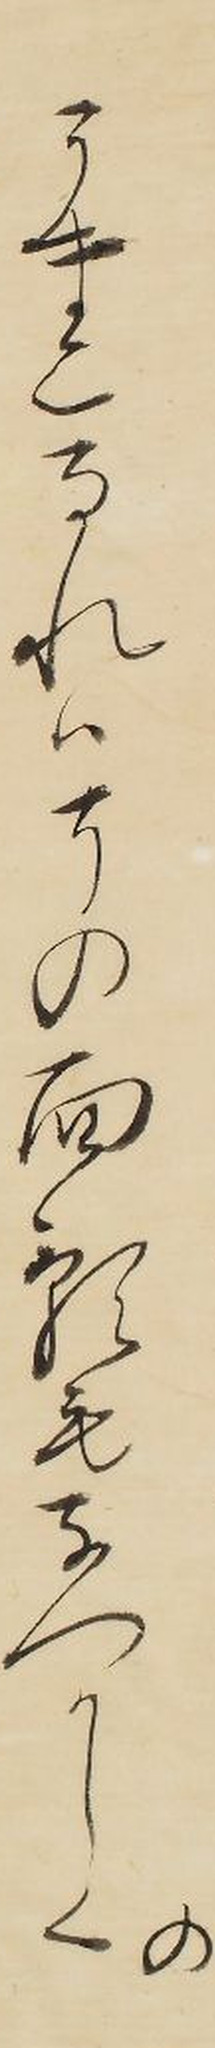うまこなれは其面影もなつかしく
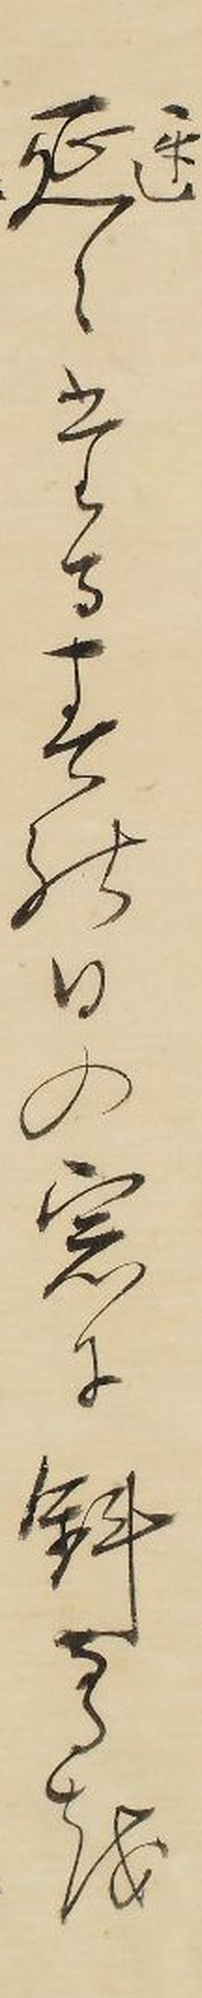遅々たる春の日の窓に斜なるを
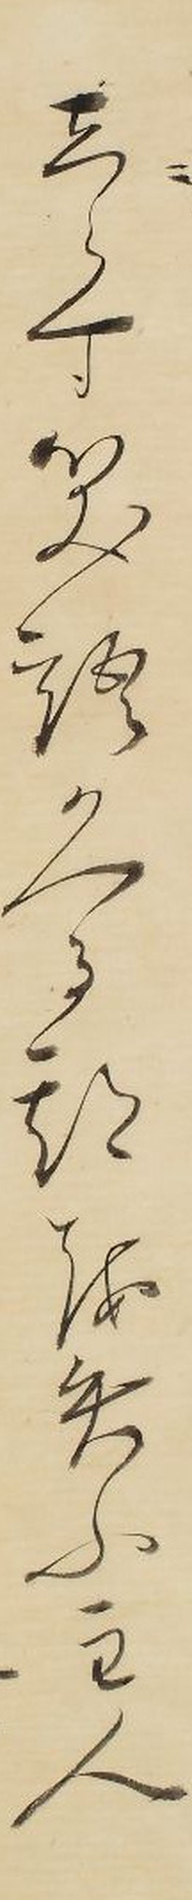しらす笑語かへる期を失ふ主人
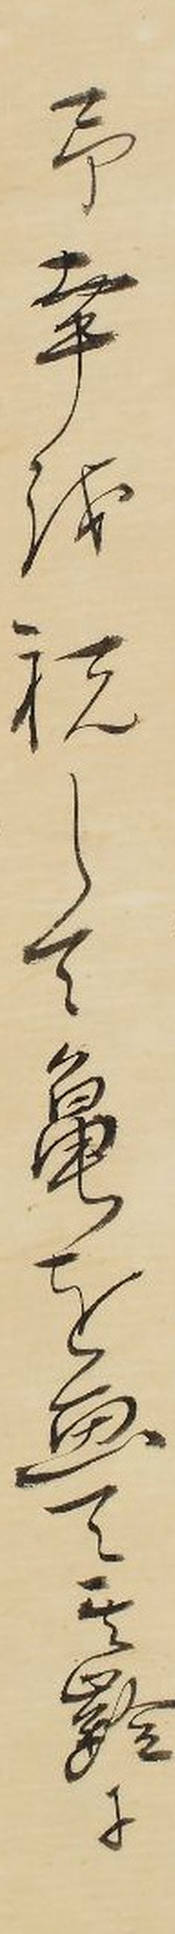予幸を祝して亀を画て其齢に
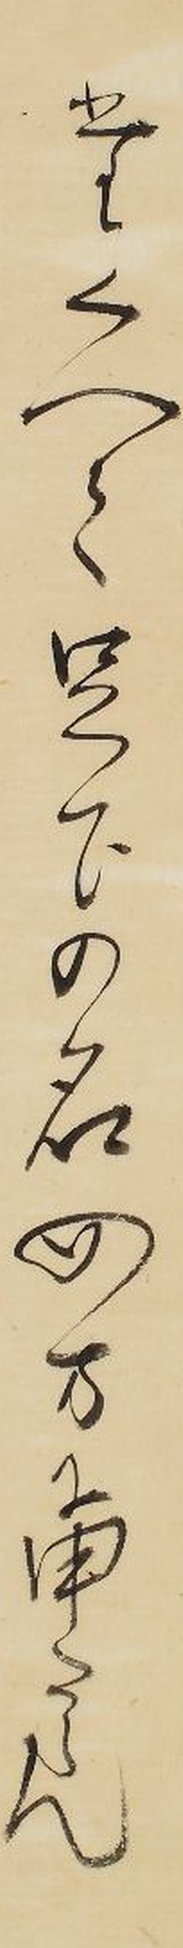たくへて足下の名四方に申たらん
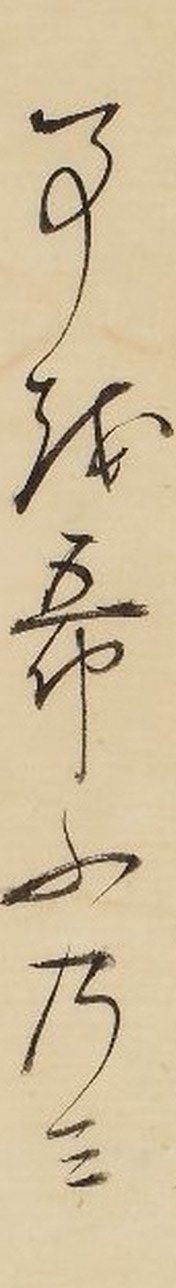事を希ふのみ
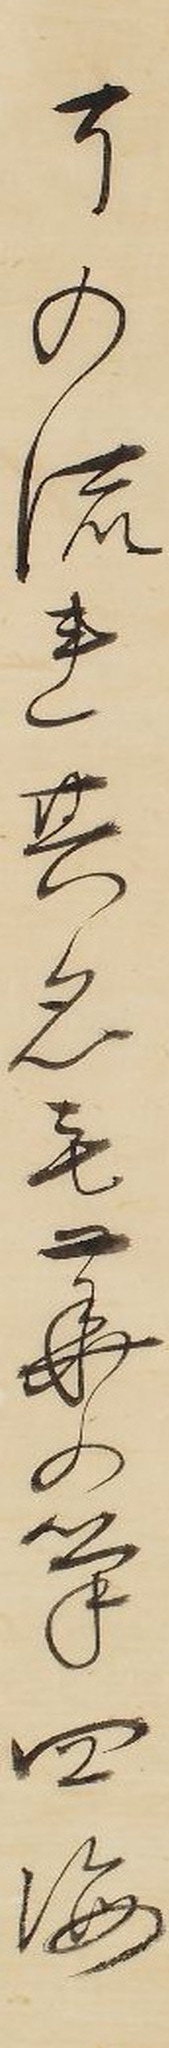その流れ其名も華の筆四海
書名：花土産
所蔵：徳島県立図書館
